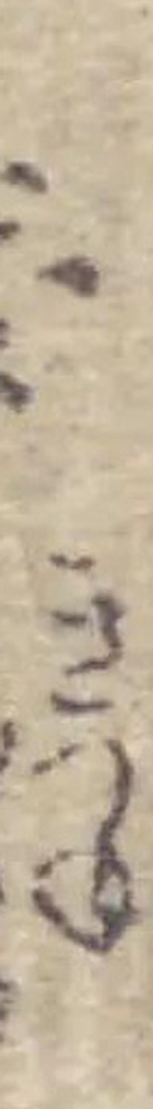きつね
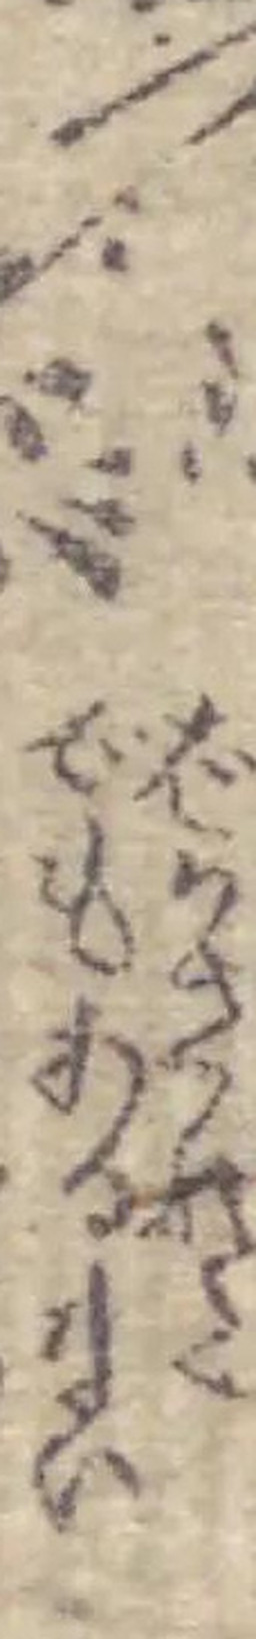でもあるまい
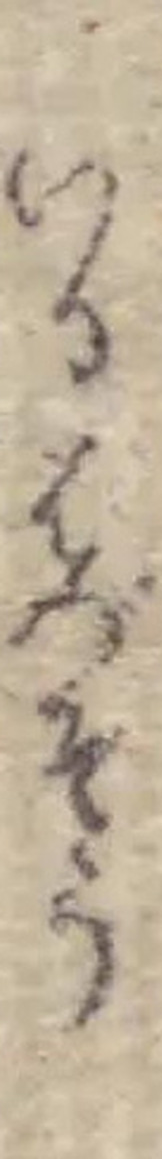いるはづそう
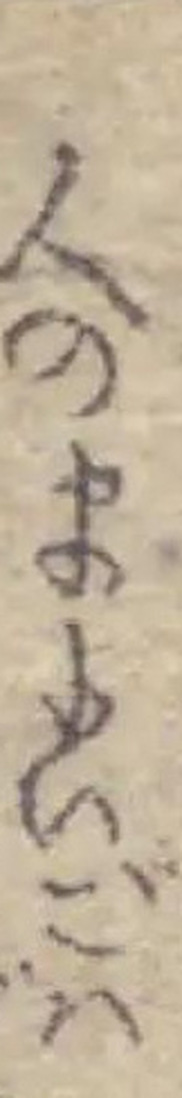人のまよいごは
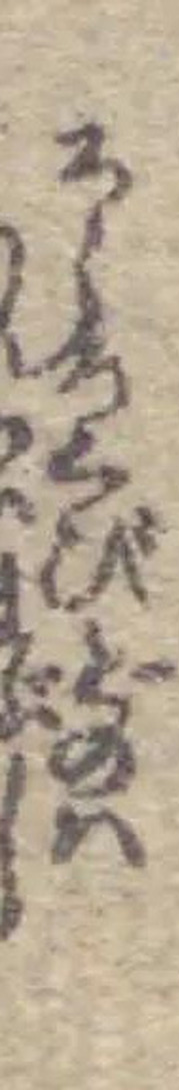ろくろくびどのは
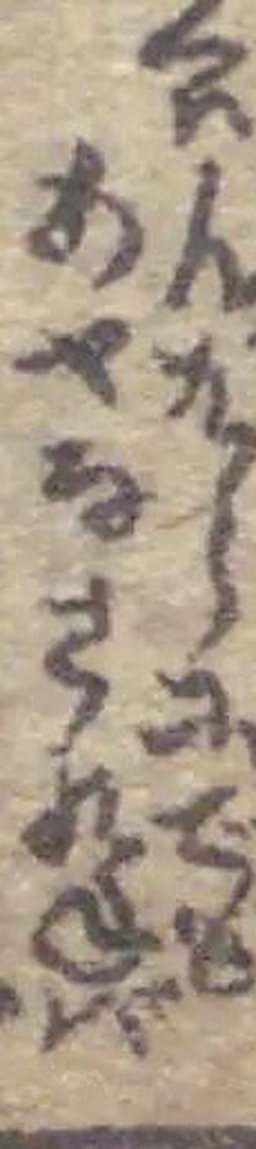あヤなされねば
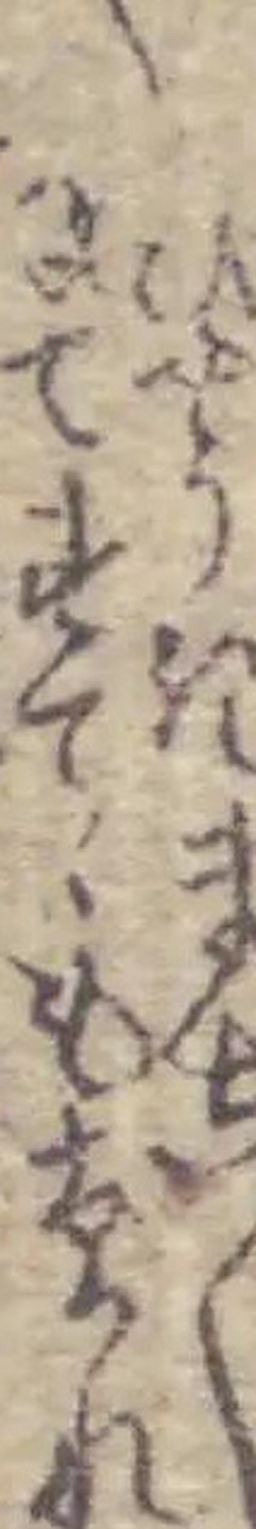にてすてゝもおられ
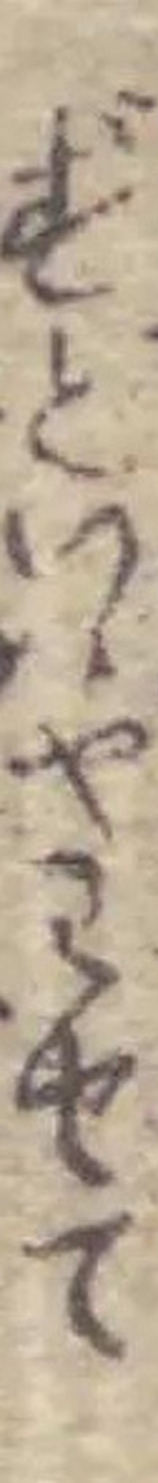ずといゝやわせて
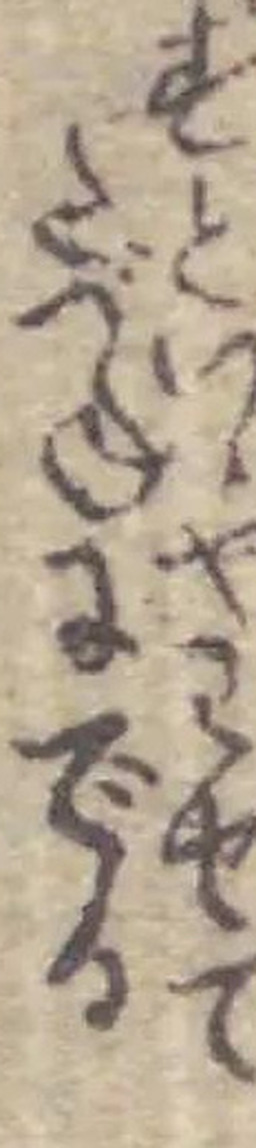たづねにでる
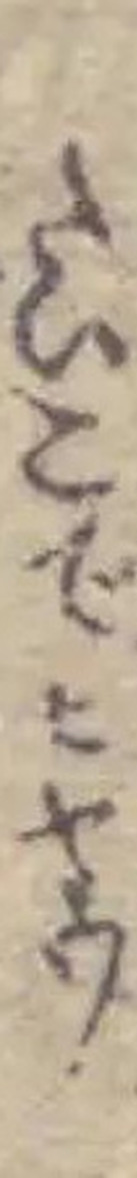たいこでヒヤウ
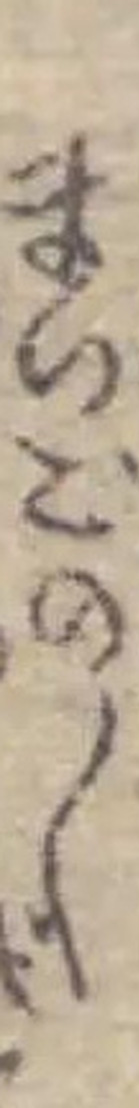まいごの〳〵

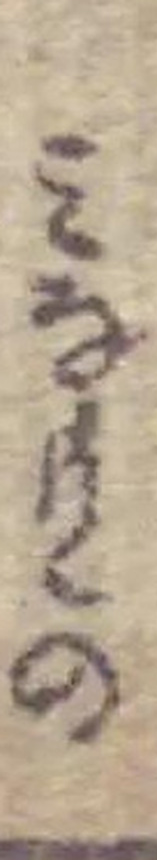みなもとの
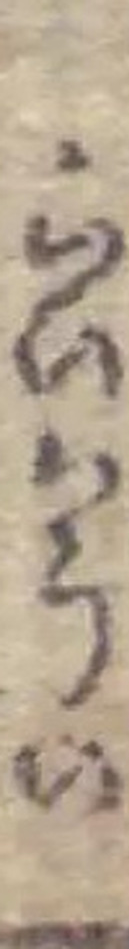らいかうの
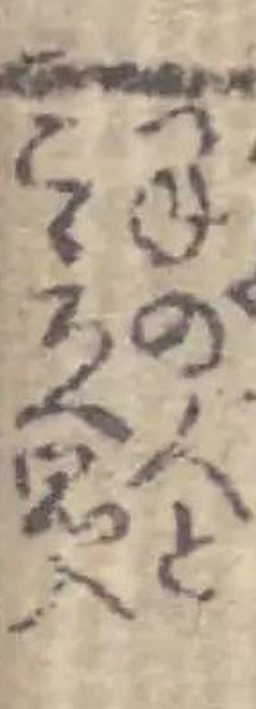こゝろへ思入
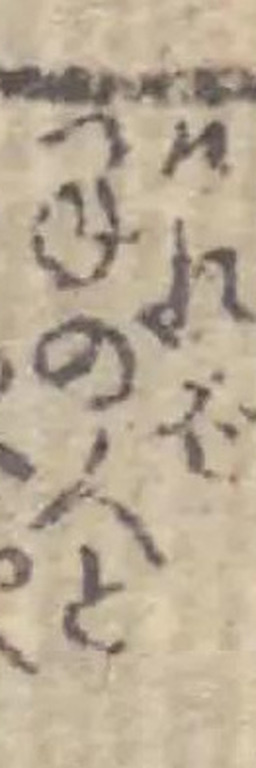つねの人と
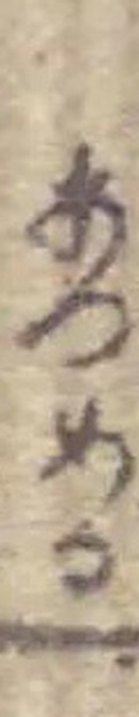あつめる
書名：化物尽 4巻
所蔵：国立国会図書館 National Diet Library, JAPAN
